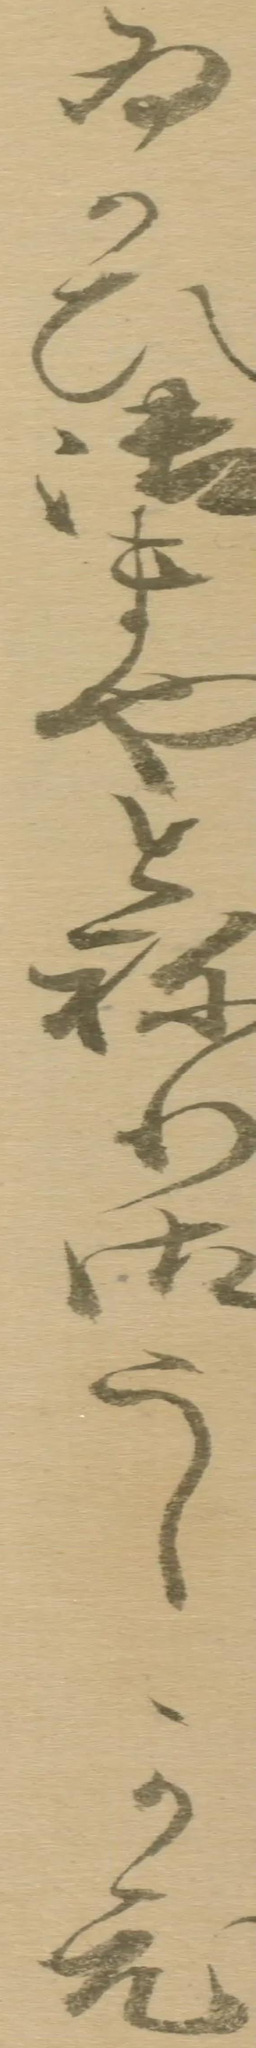ゐかひ御まやとねり御うしかひ
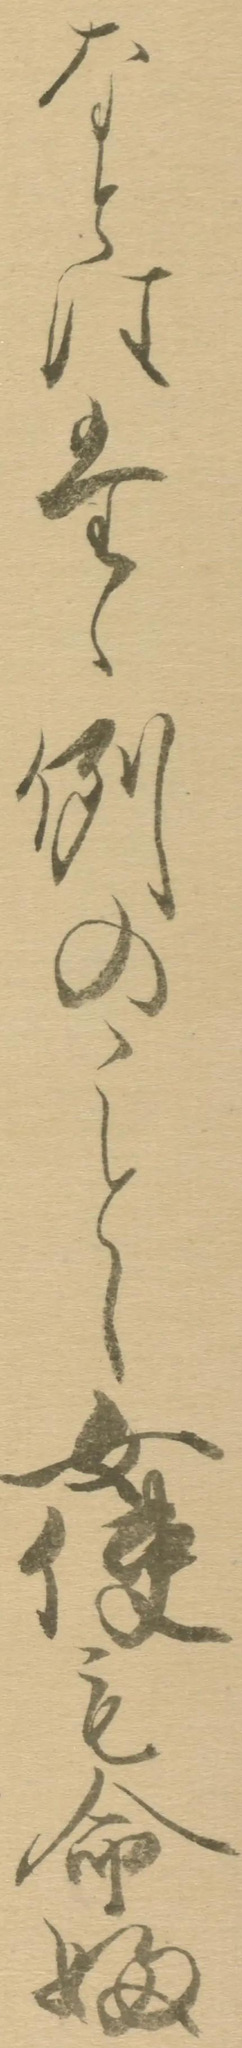なとはたゝ例のことし女使も命婦
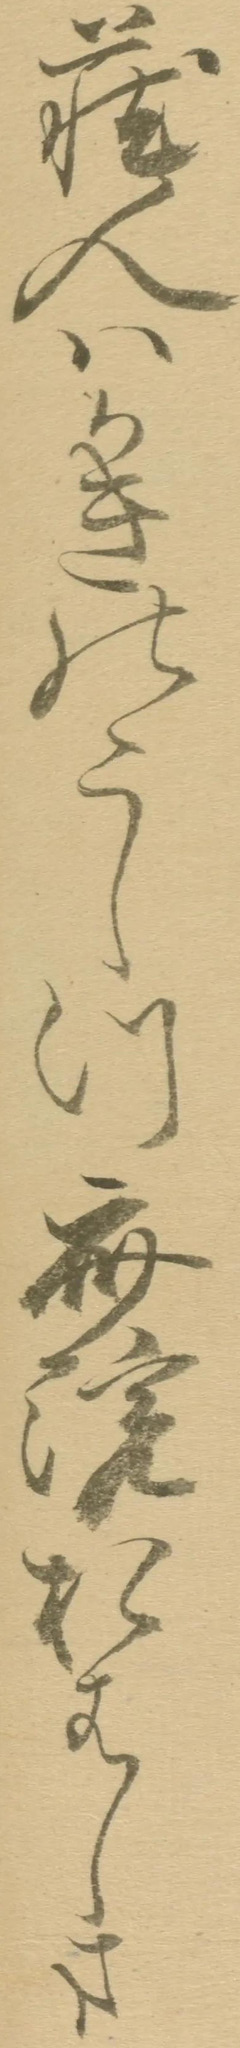蔵人はかきのこしつ斎院おはしま
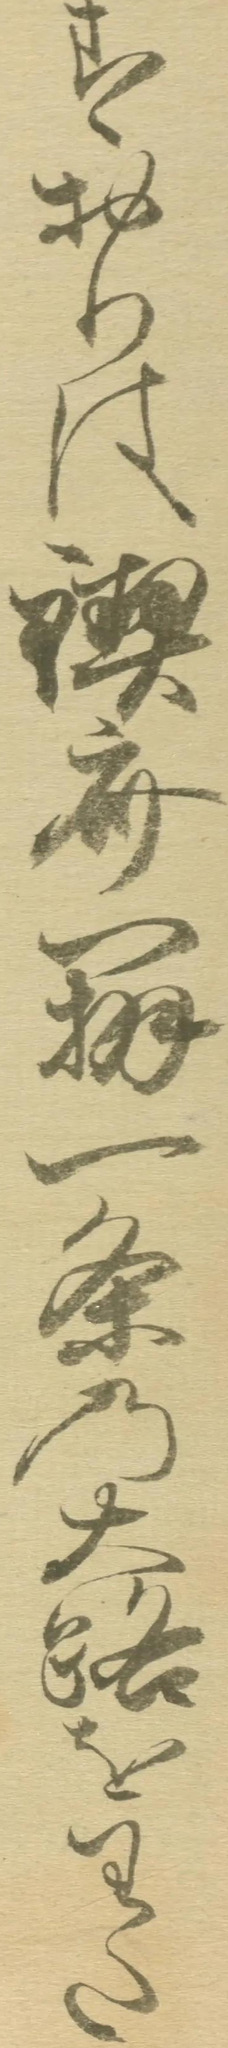すおりは禊斎弁一条の大路をわた
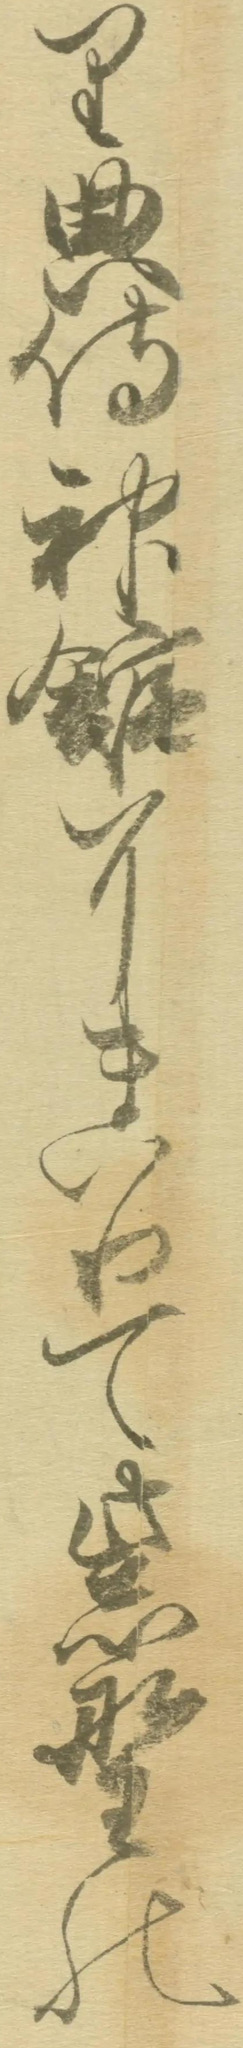り典侍神館にまいりて紫野の
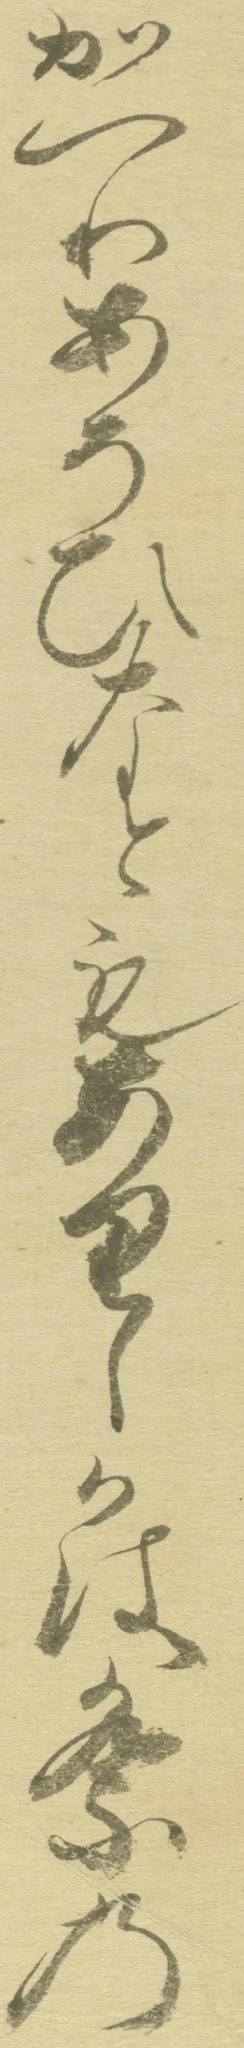かへりあそひなともありしかは祭の
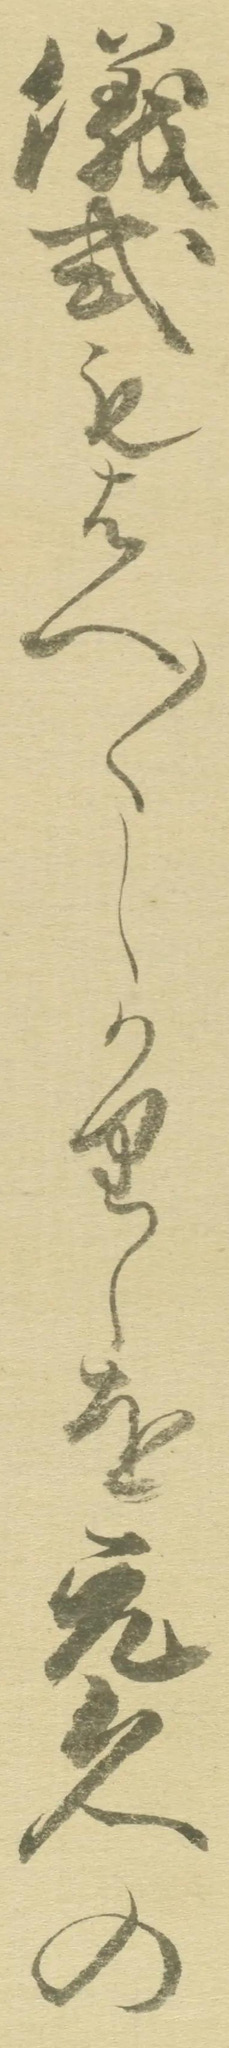儀式もはへ〳〵しかりしを元久の
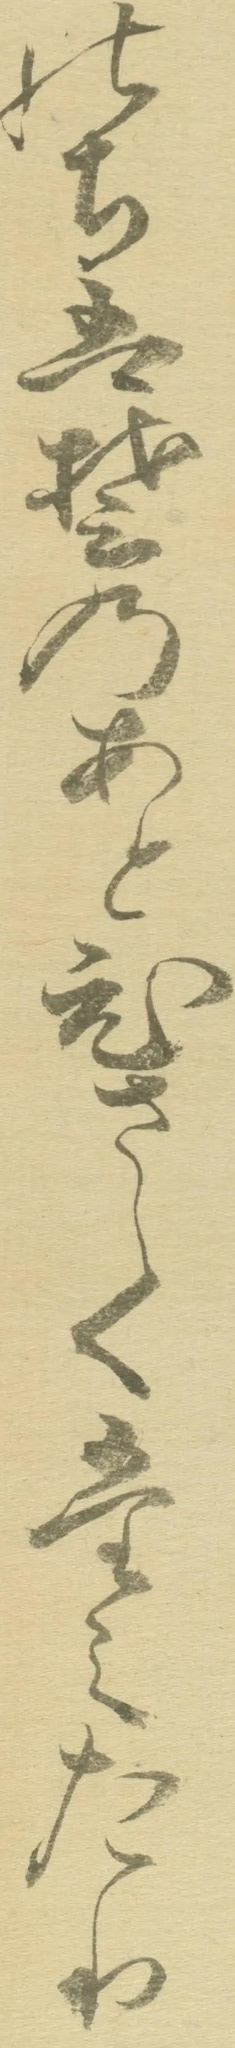のちはそのあとひさしくたえたり
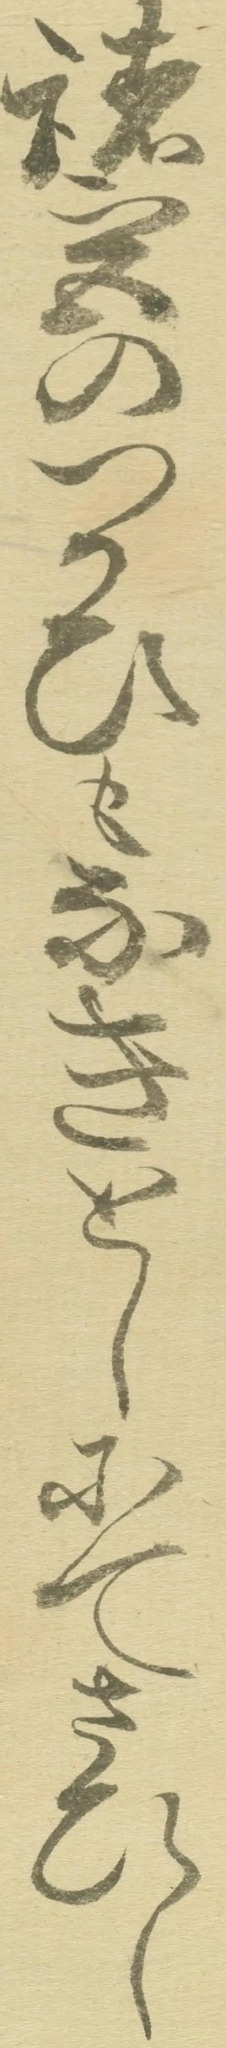諸宮のつかひもなきとしにてさひし
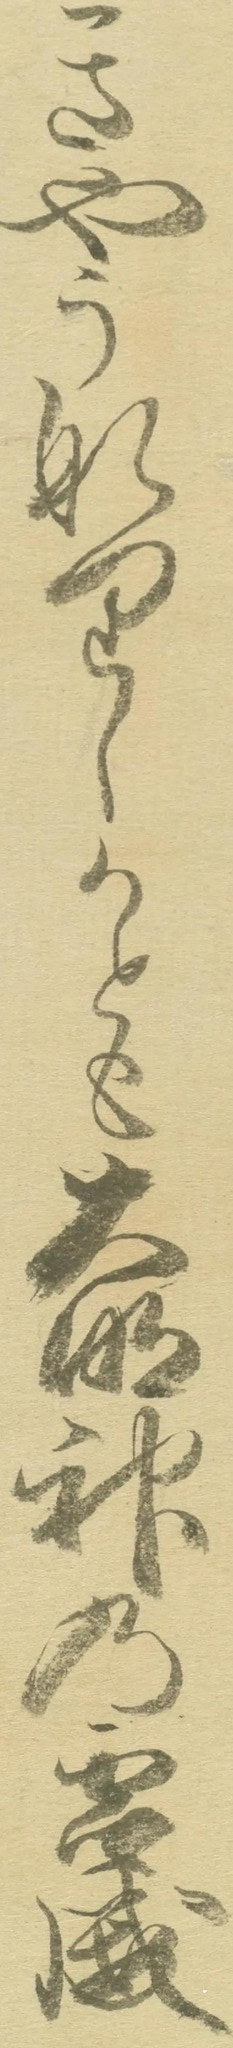きやうなりしかとも大明神の霊威
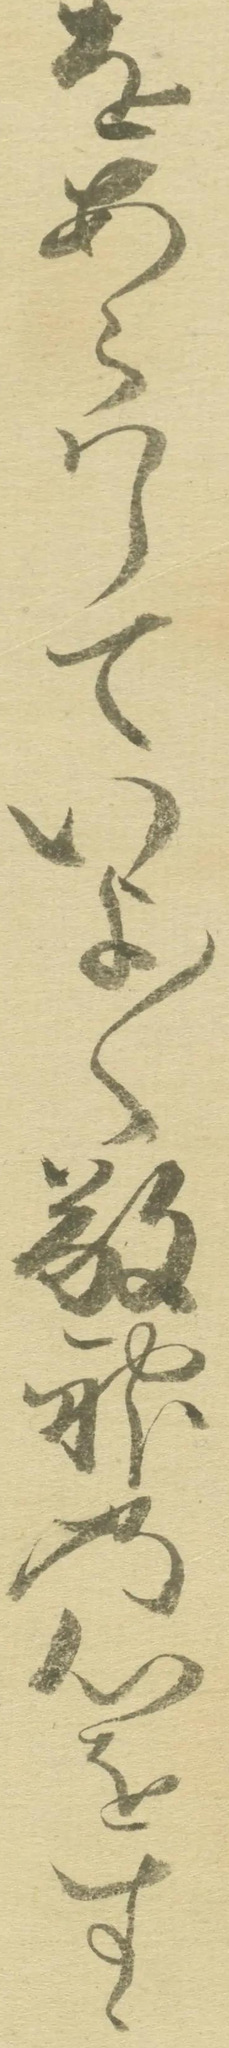をあらはしていよ〳〵敬神の心をすゝ
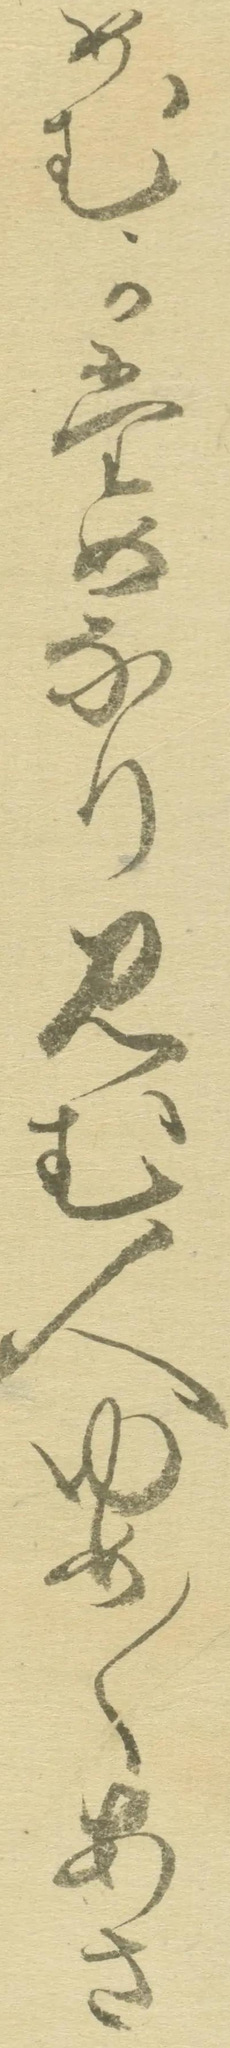めむかためなり見む人ゆめ〳〵あさ
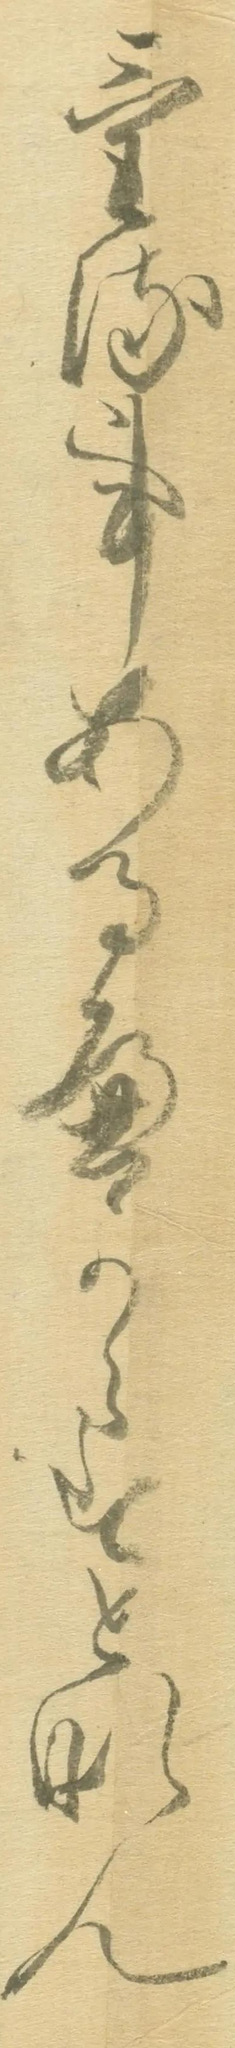ける事あるへからすとなん

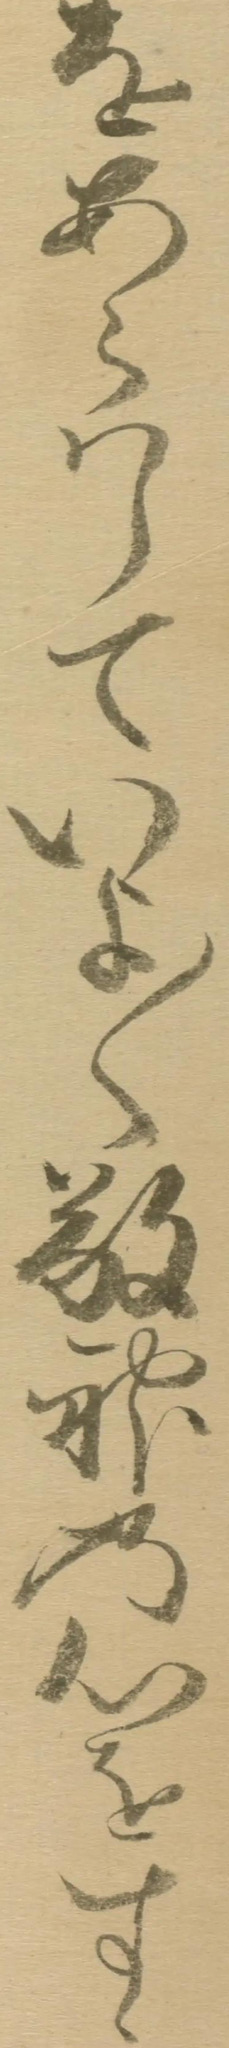をあらはしていよ〳〵敬神の心をすゝ
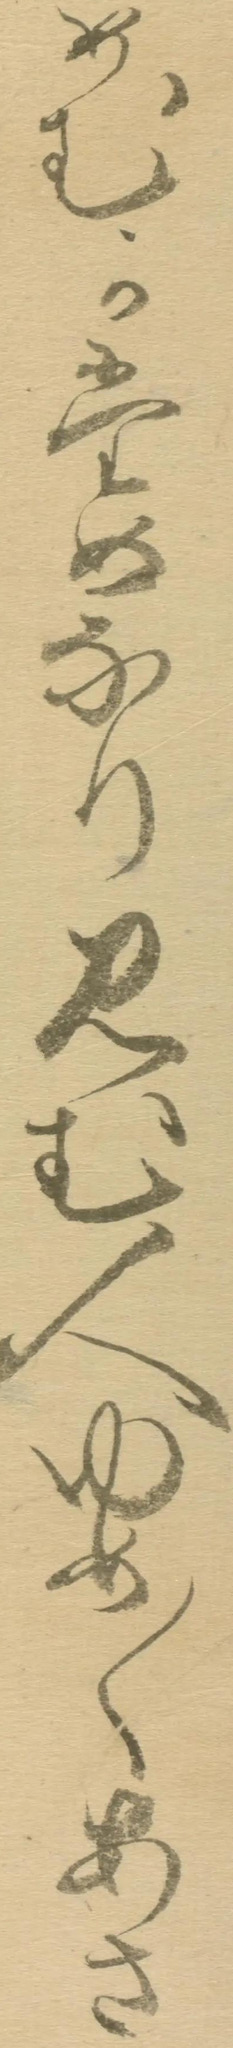めむかためなり見む人ゆめ〳〵あさ
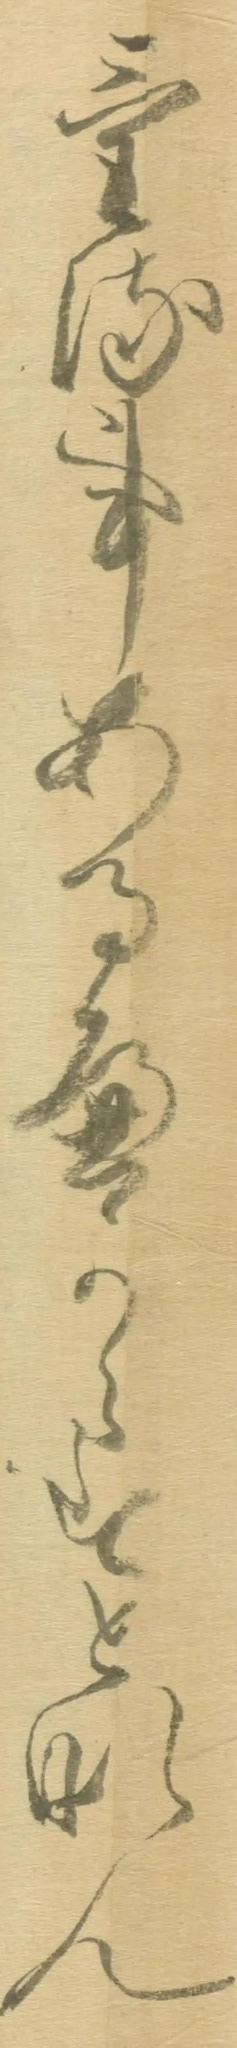ける事あるへからすとなん
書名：賀茂祭縁起
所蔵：国立国会図書館 National Diet Library, JAPAN
